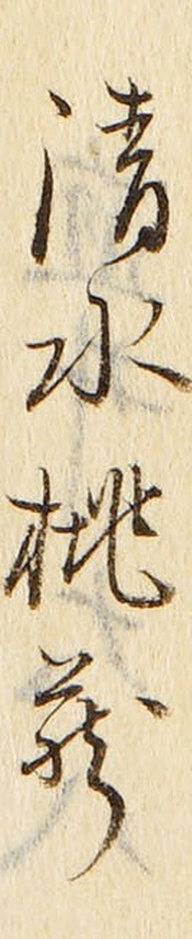清水桃蔵
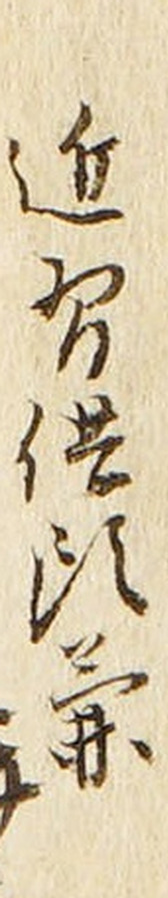近習供頭兼
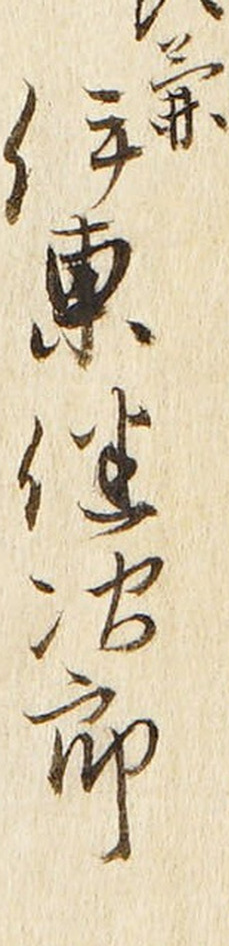伊東健次郎
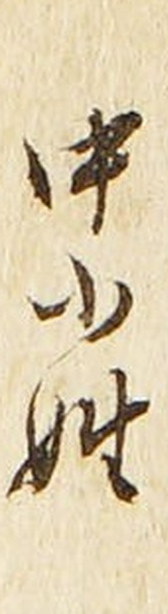中小姓
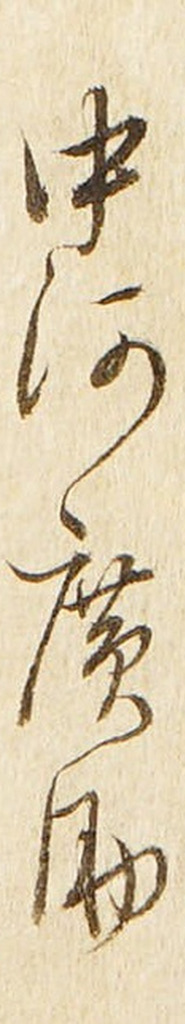中河広助
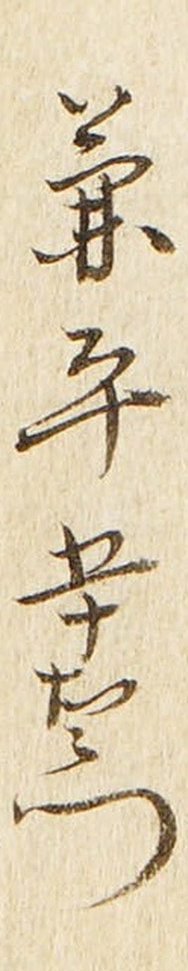兼平五十右衛門
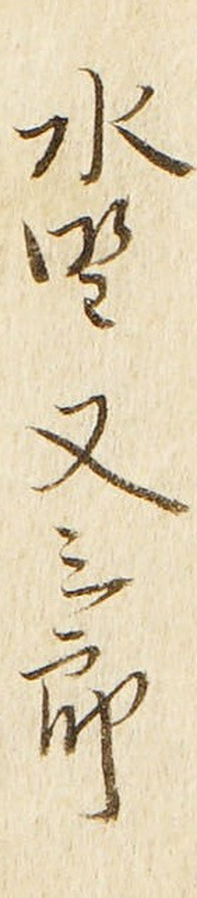水野又三朗
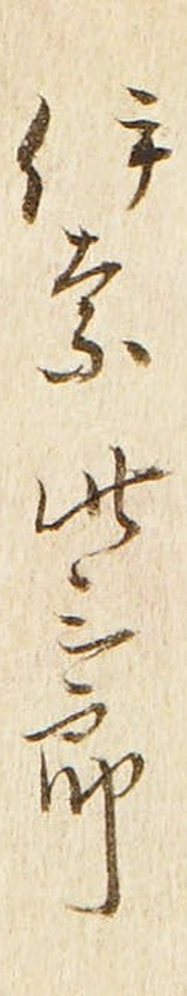伊奈此三郎
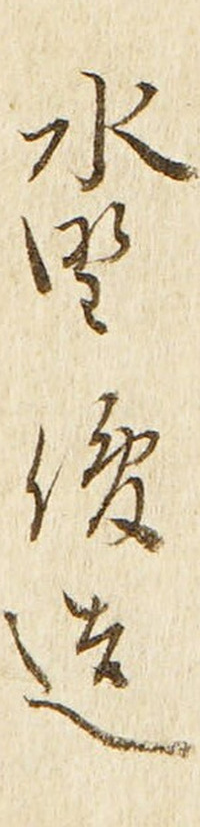水野俊造
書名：長崎漂流記
